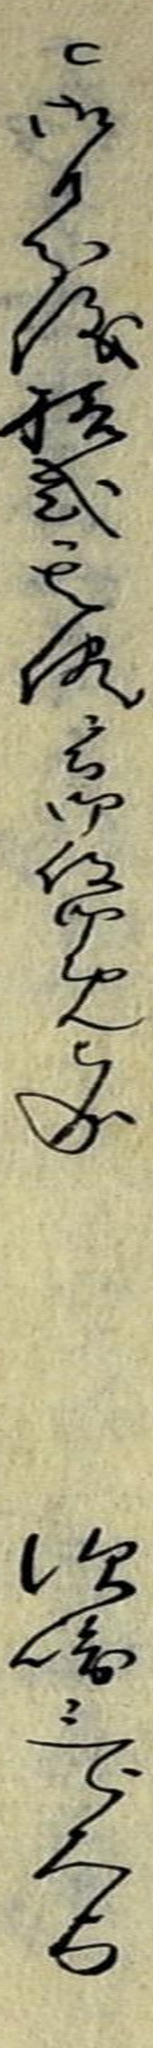〇御自分儀格式其侭に而御役御免被成須崎三郎右衛門
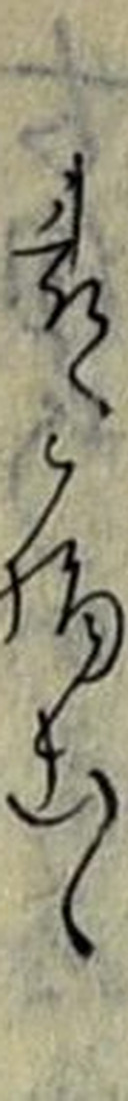表へ被指出候
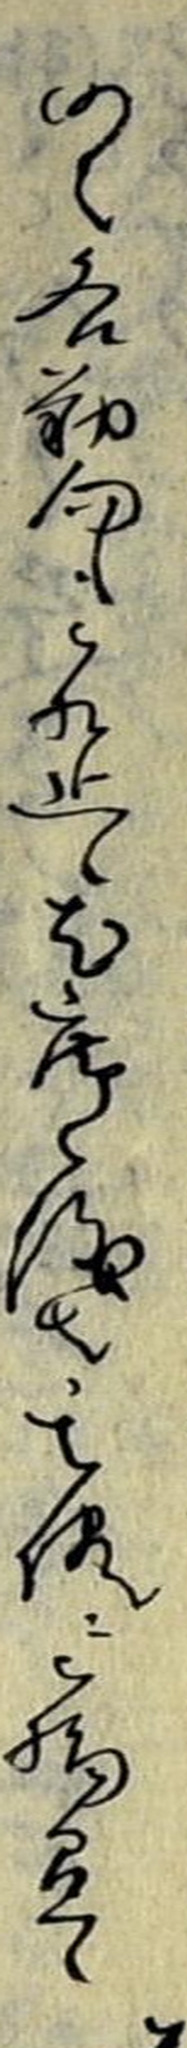仍之各勤向も被相止候尤席之儀其侭に被指置候
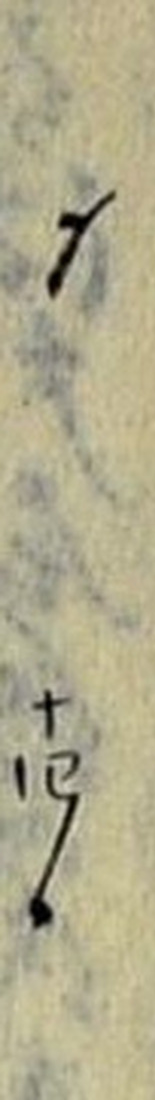〆十四日
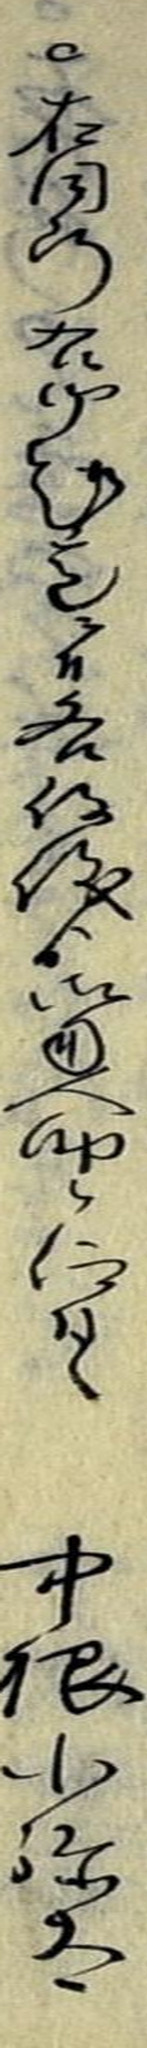〇右同断右御趣意に付各役儀ゟ御用人助被仰付候中根小弥太
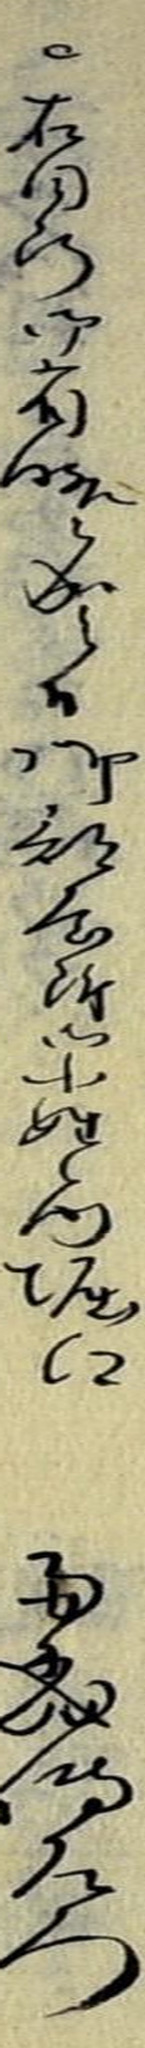〇右同断御省略被成之付御部屋附小姓之内堀江雨森伝左衛門
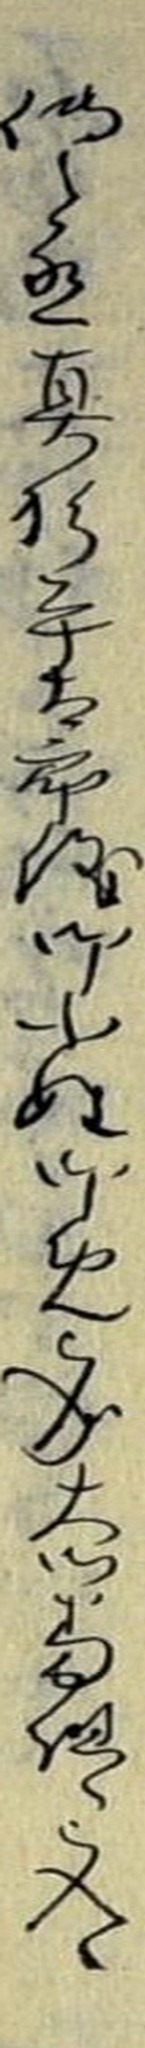伝之丞真杉平太郎儀御小姓御免被成大御番組へ被入候
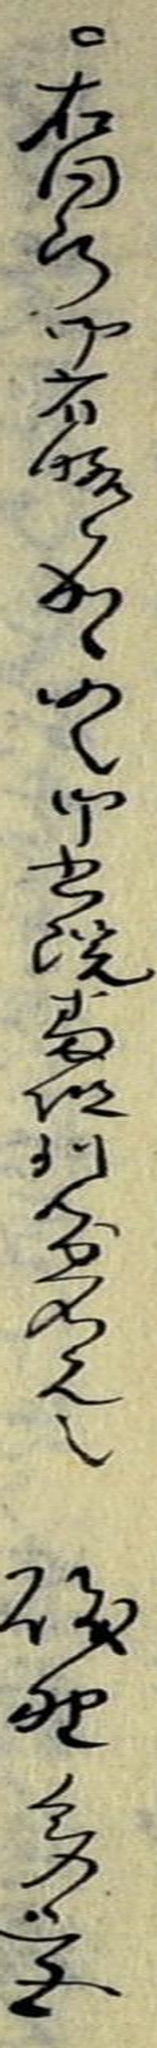〇右同断御省略被成候仍之御書院番組別紙名元之磯野多宮
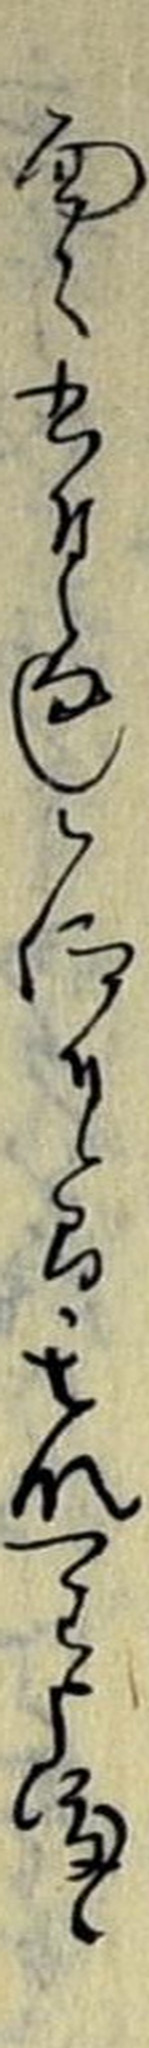面々書付之通被仰付候間其段可被申渡候
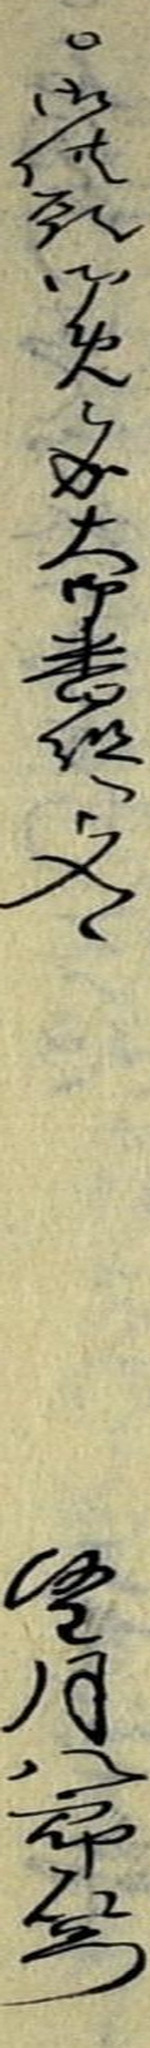〇御供頭御免被成大御番組へ被入候望月八郎左衛門
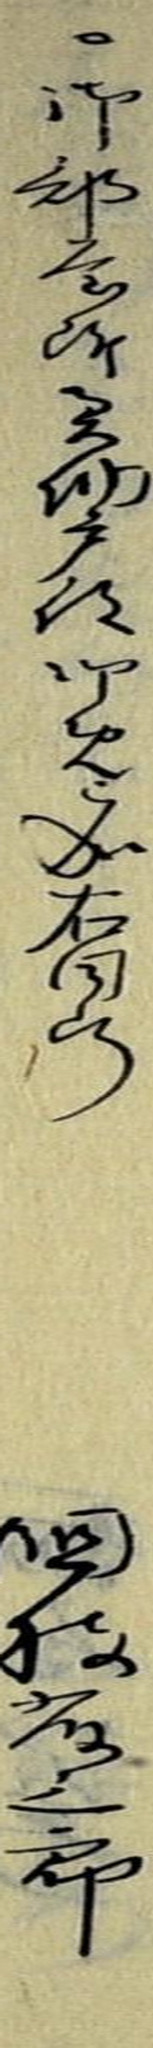〇御部屋附奥納戸役御免被成右同断国枝藤三郎
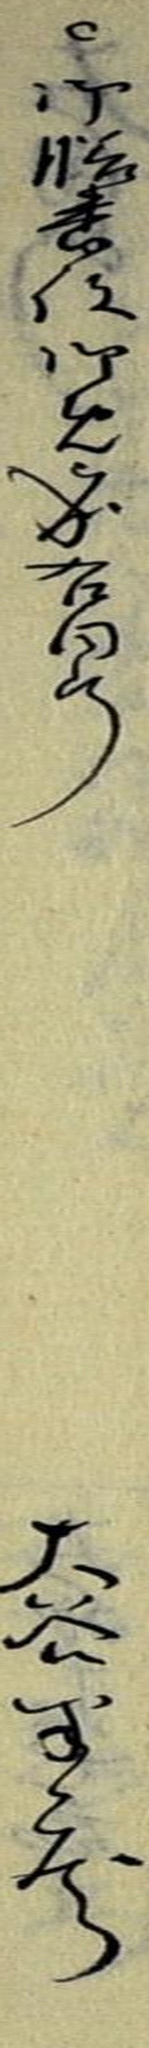〇御膳番役御免被成右同断大谷半蔵
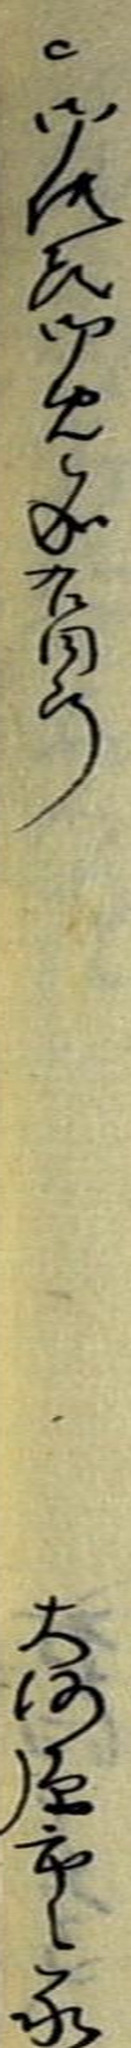〇御供頭御免被成右同断大河原市之丞
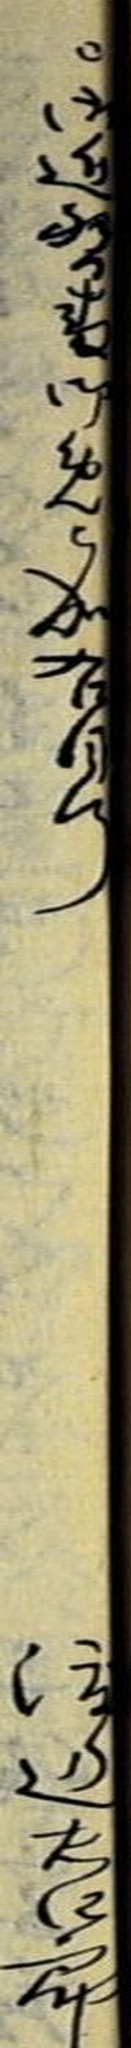〇御近習番御免被成右同断渡辺忠四郎
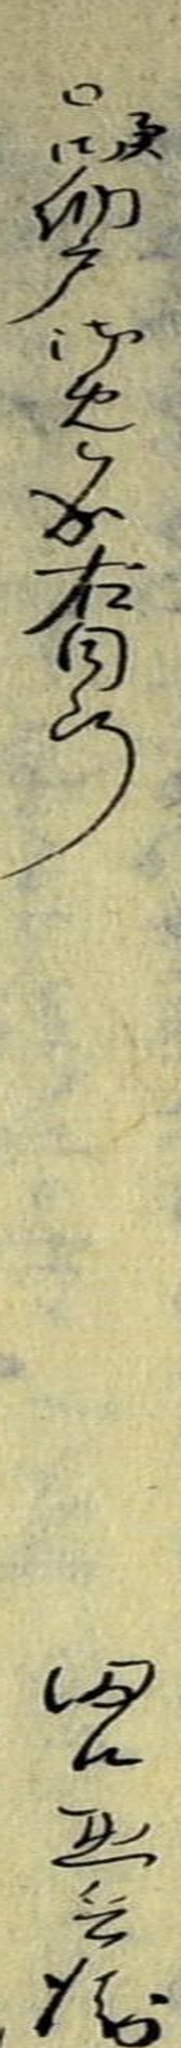〇御納戸御免被成右同断田口惣兵衛

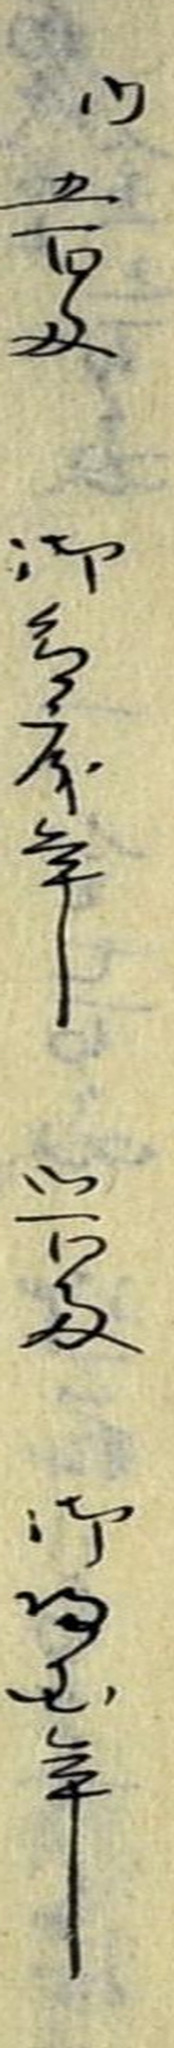内五百両御参府年弐百両御帰国年
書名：命令之部 二
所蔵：福井県文書館 Fukui Prefectural Archives
